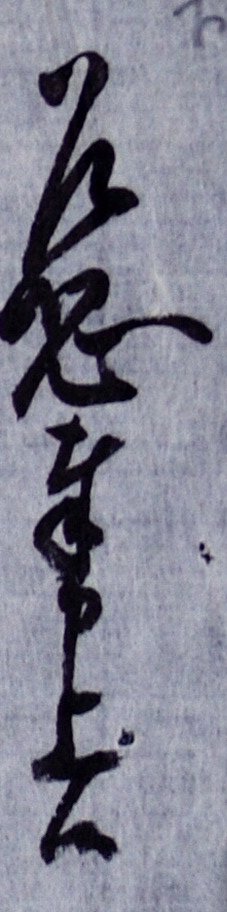乍恐奉申上候
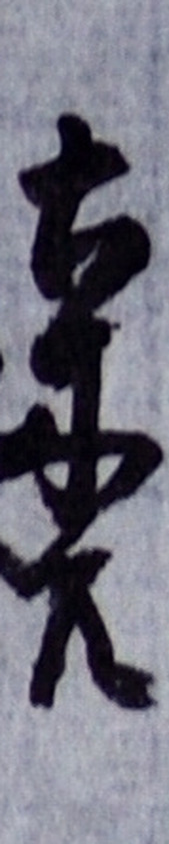古木共
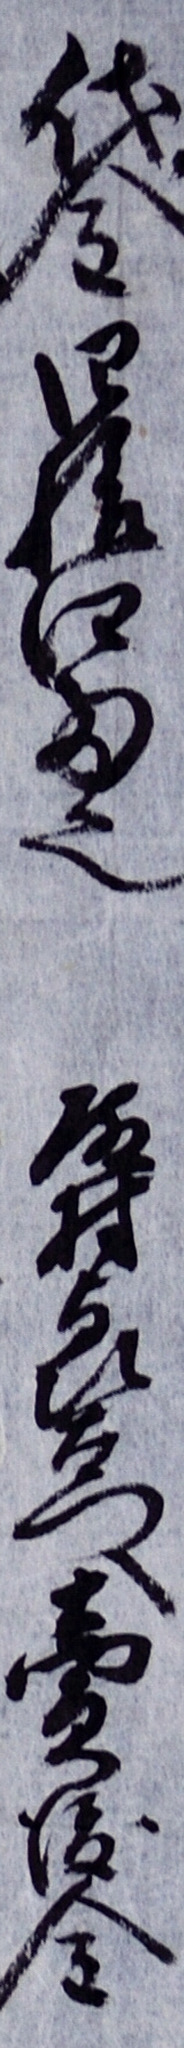代金四拾四両也藤村与次左衛門へ売渡金
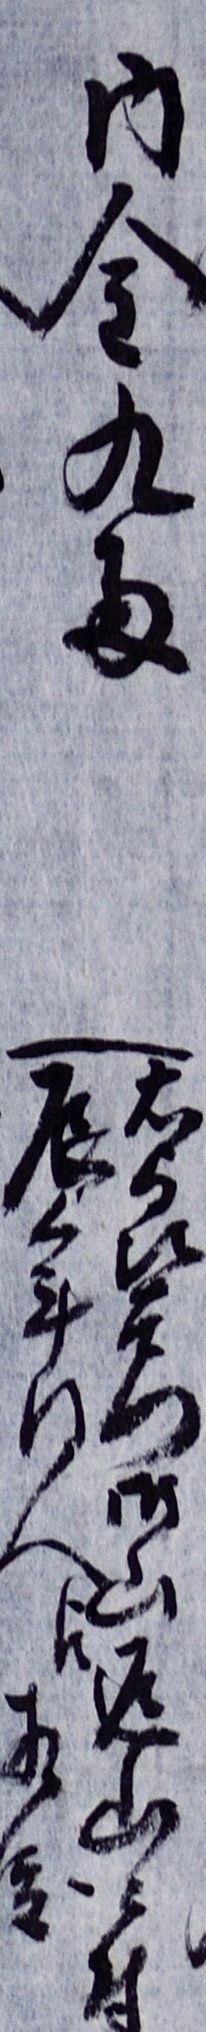内金九両右与次左衛門御山返山ニ付
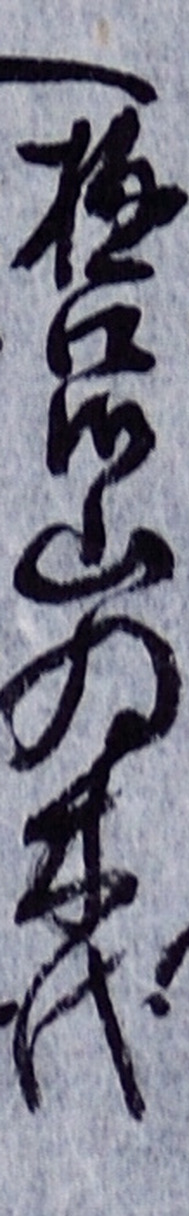樋口御山為木代
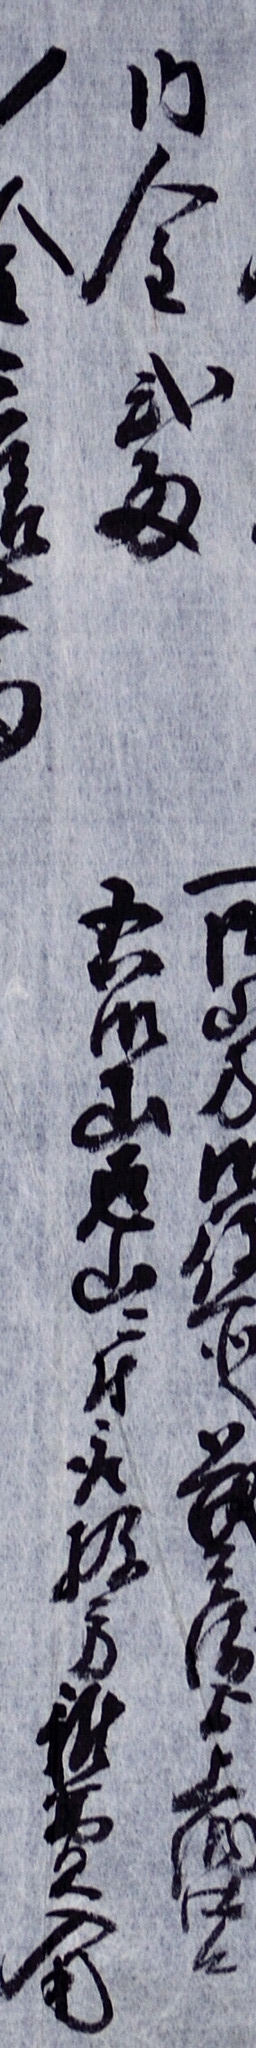内金弐両右御山返山ニ付取扱方誰費入用
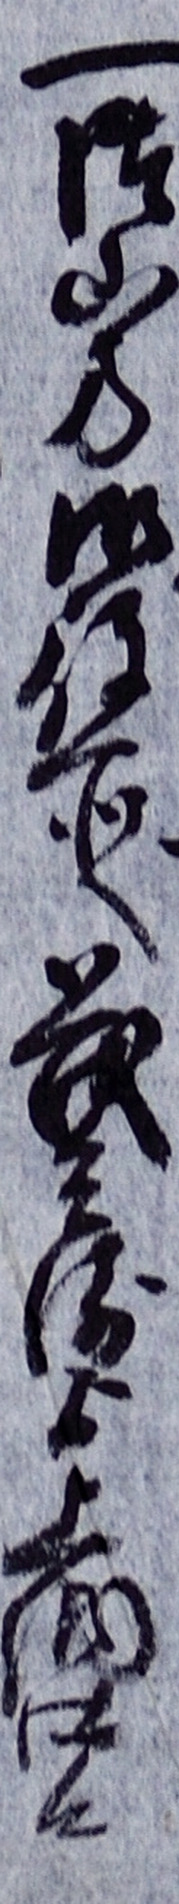御山方御役所へ茂兵衛ヨリ上納仕候
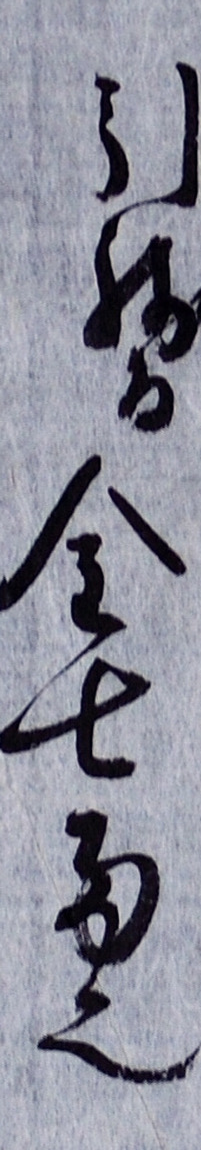引残而金七両也
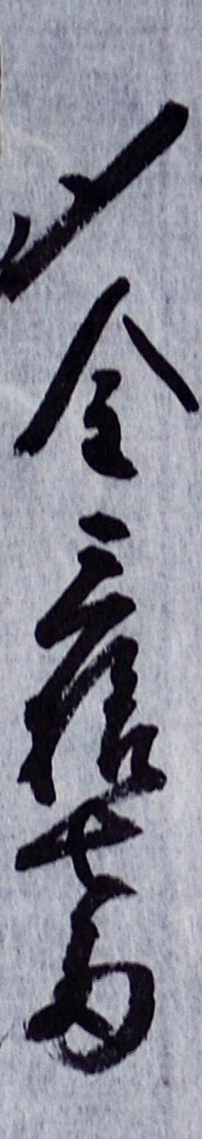〆金三拾七両
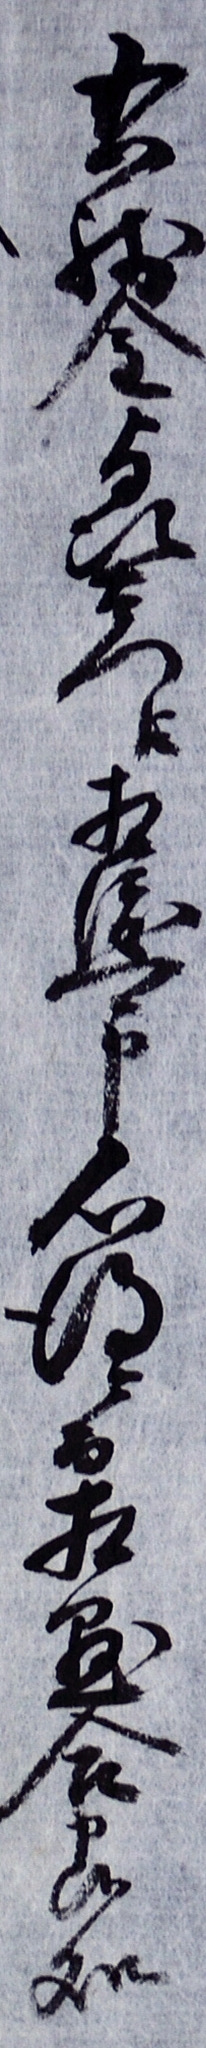右残金与次左衛門江相渡可申心得ニ而相懸合申候処
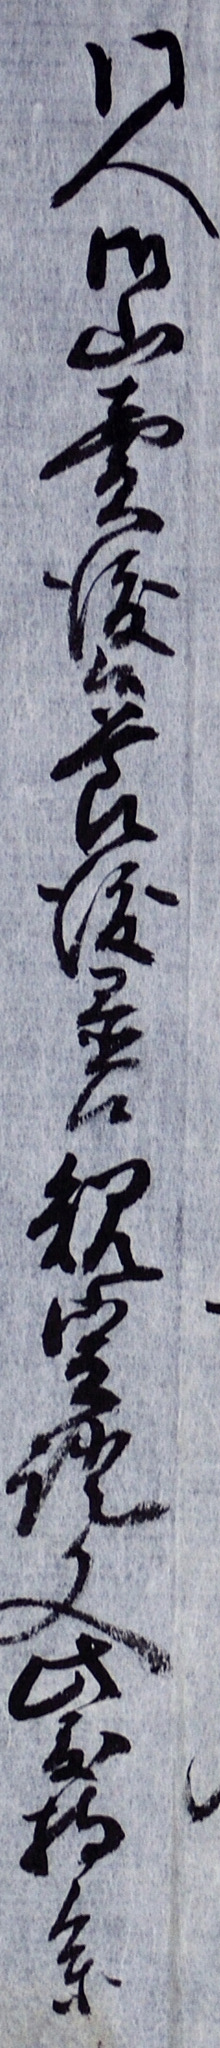同人御山売渡候節後置候観定証文此度持参
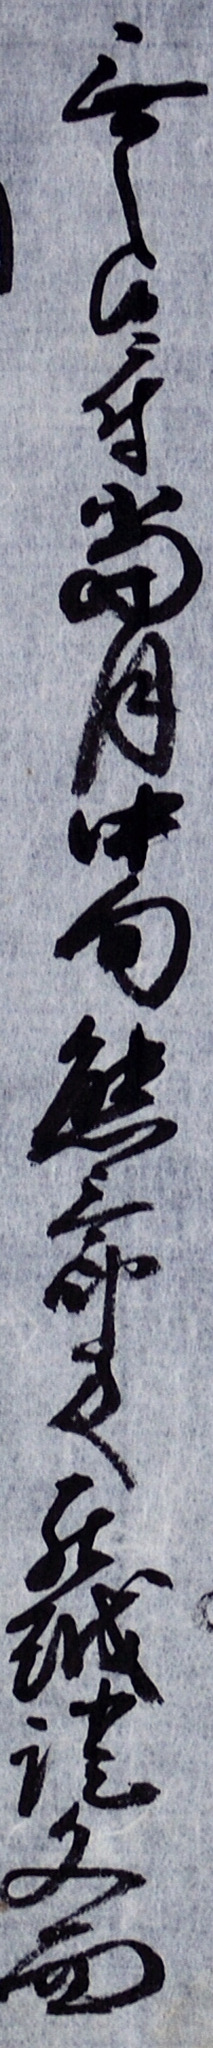無之候ニ付当月中旬熊三郎方へ罷越証文面
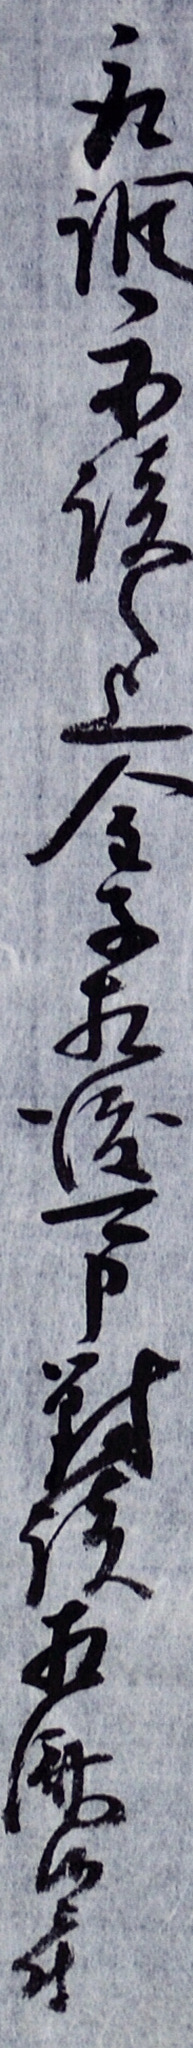取調示談之上金子相渡可申対談相済候ニ付
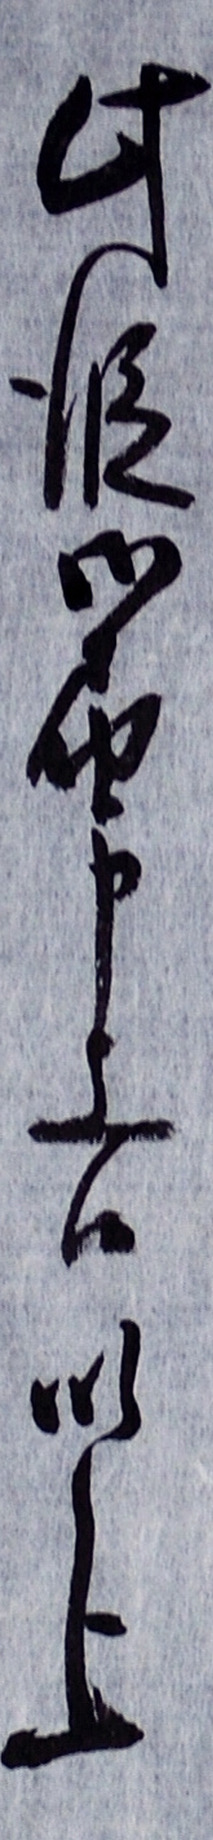此段御届申上候以上
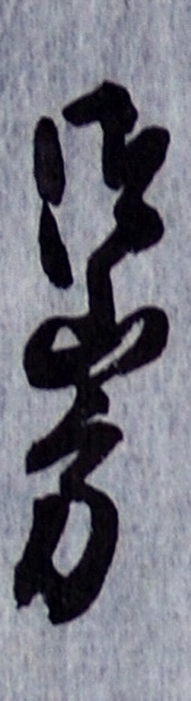御山方
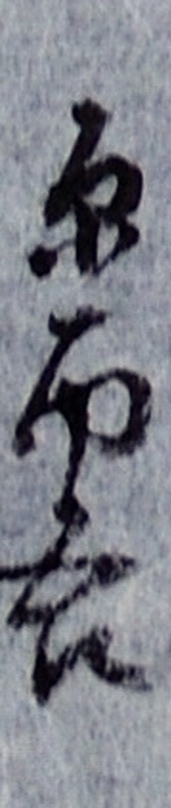原布吾
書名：乍恐奉申上候
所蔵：伊那市立高遠町図書館・合同会社AMANE
